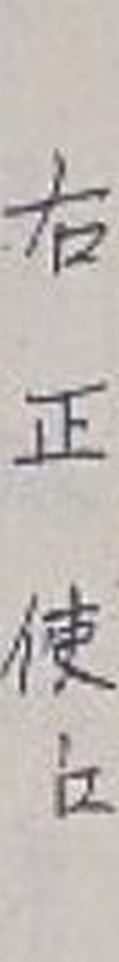右正使え
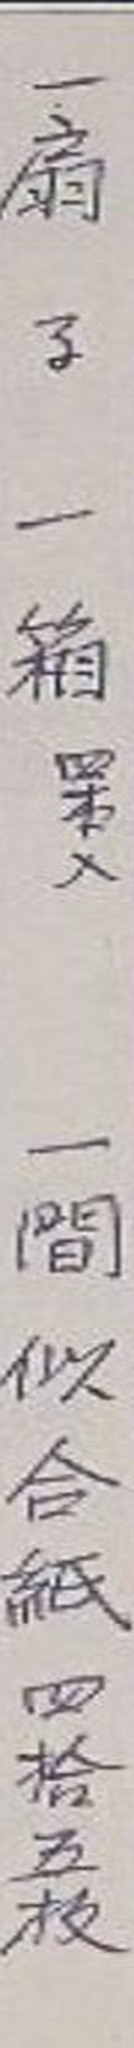一扇子一箱二本入一間似合紙四拾五枚
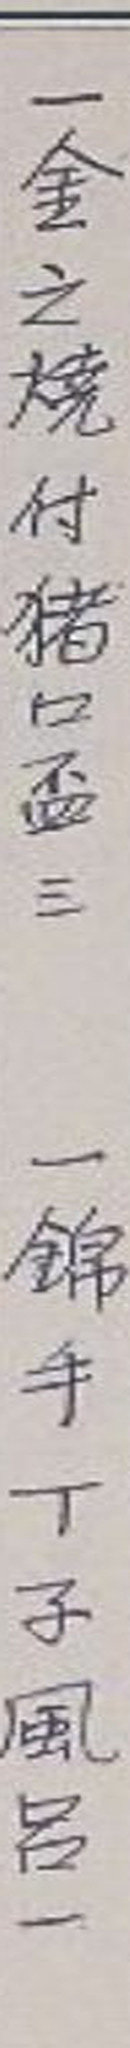一金之焼付猪口盃三一錦手丁子風呂一
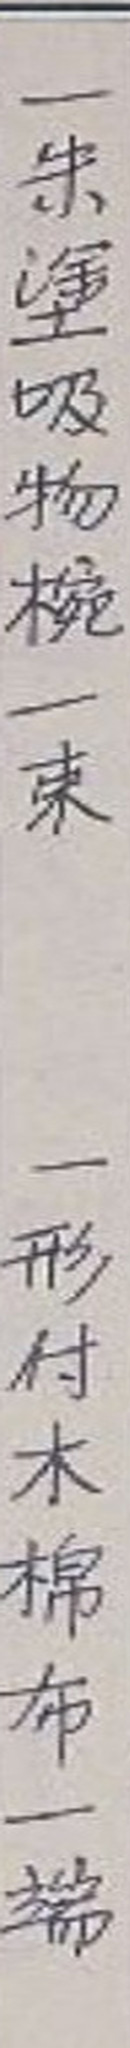一朱塗吸物椀一束一形付木棉布一端
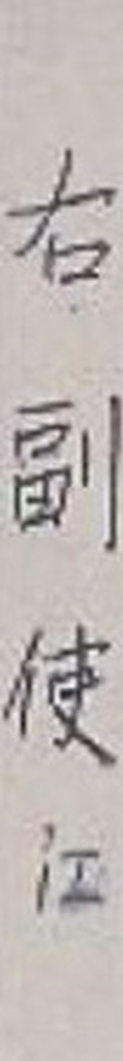右副使え
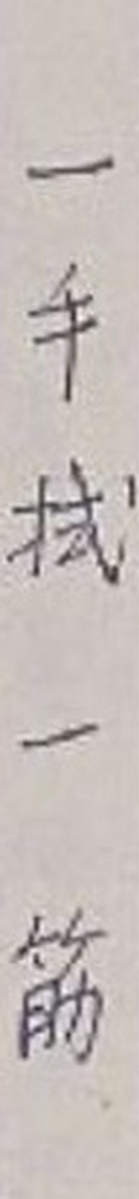一扇子一箱一手拭一筋
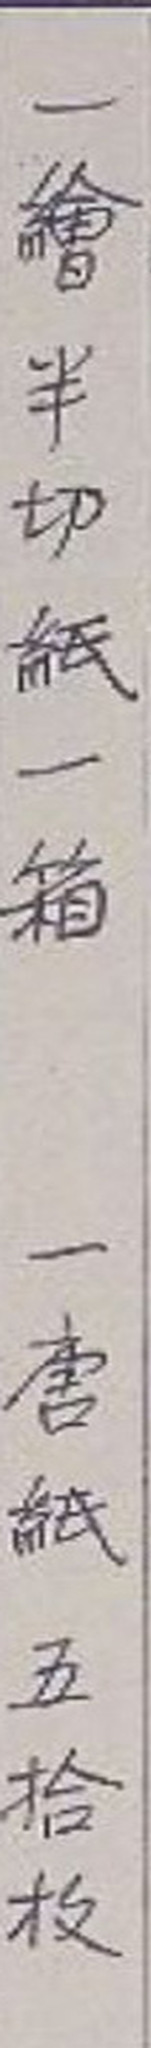一絵半切紙一箱一唐紙五拾枚
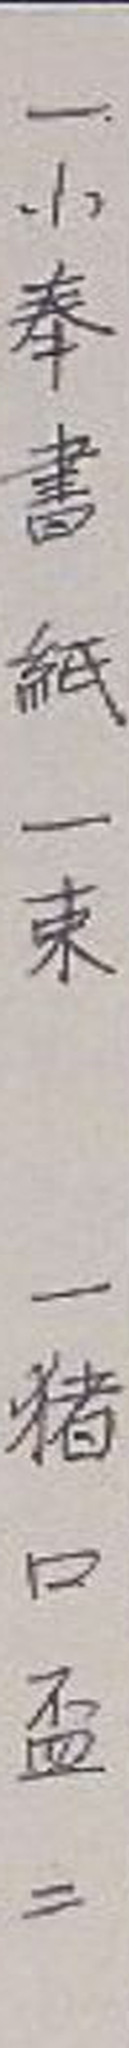一小奉書紙一束一猪口盃二

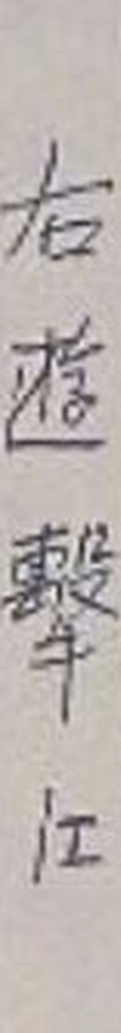右遊撃え
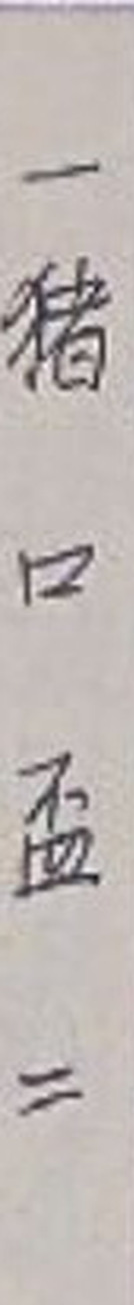一猪口盃四
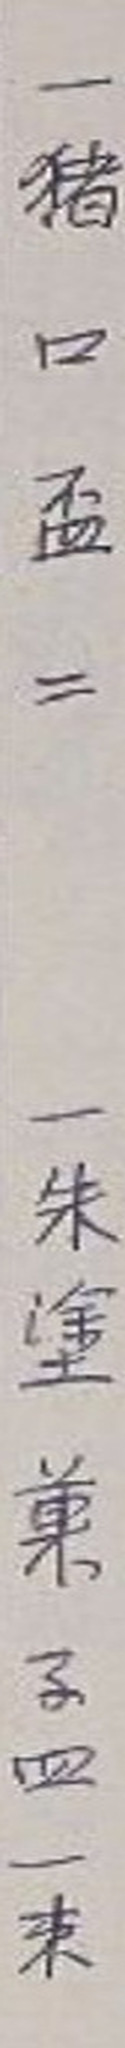一猪口盃二一朱塗菓子皿一束
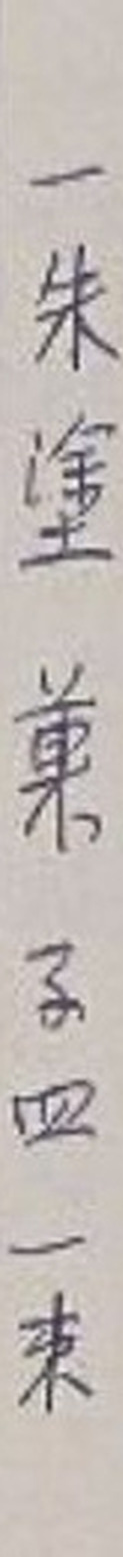一猪口盃二一朱塗菓子皿一束
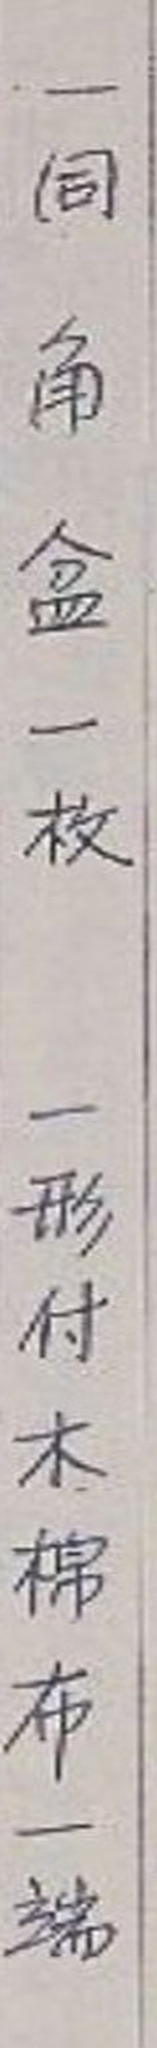一同角盆一枚一形付木棉布一端
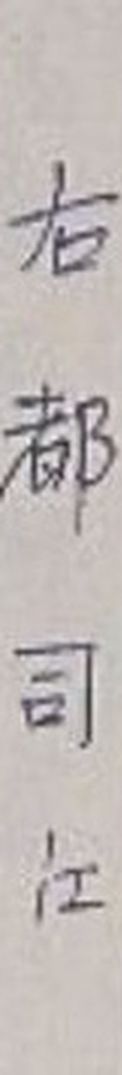右都司え
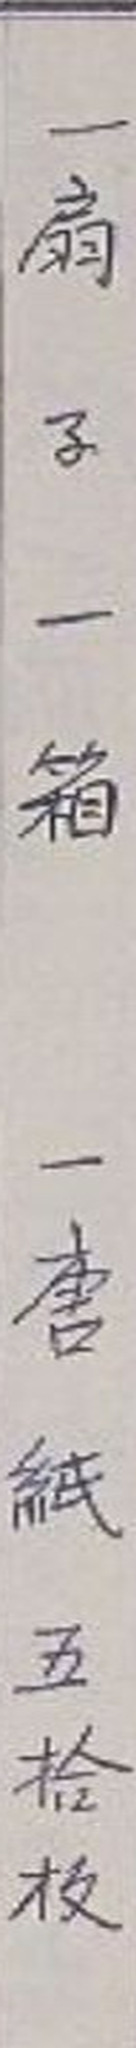一扇子一箱一唐紙五拾枚
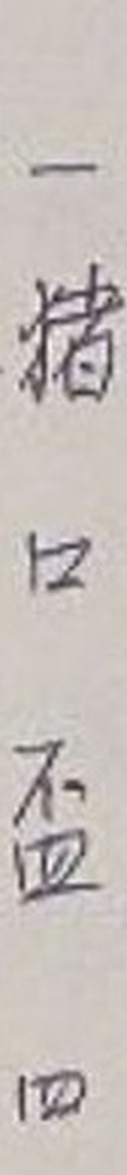一猪口盃四
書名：支那冊封使来琉諸記 下巻
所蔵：University of the Ryukyus Library
